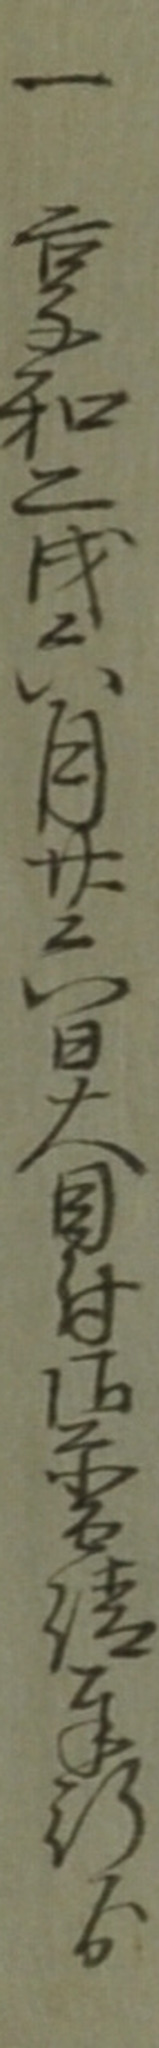一享和二戌六月廿六日大目付御普請奉行ゟ
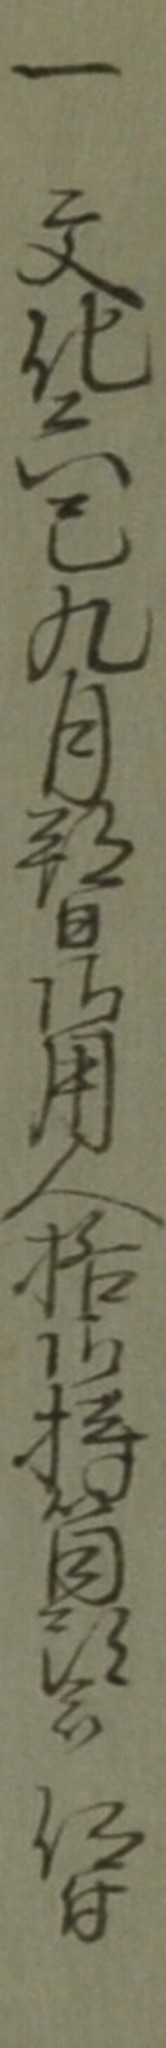一文化六巳九月朔日御用人格御持筒頭被仰付
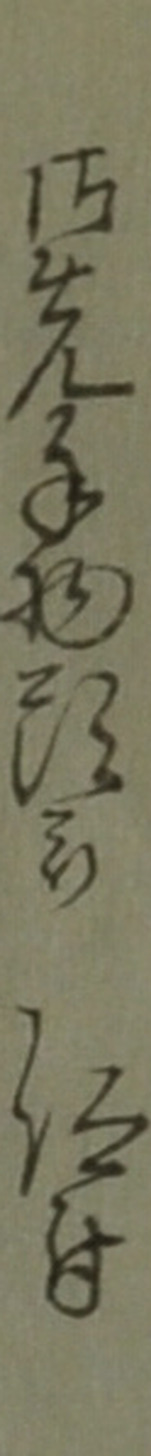御先手物頭被仰付
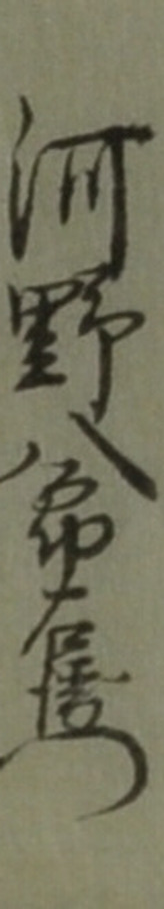河野八郎右衛門
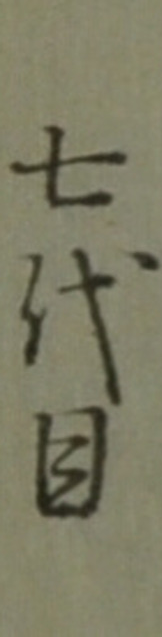七代目
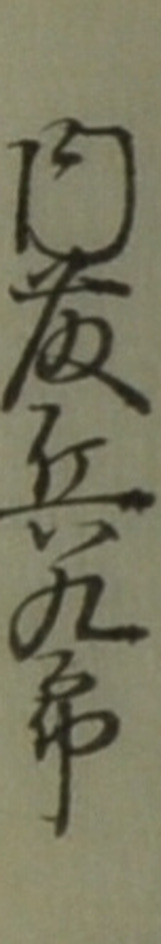内藤兵九郎
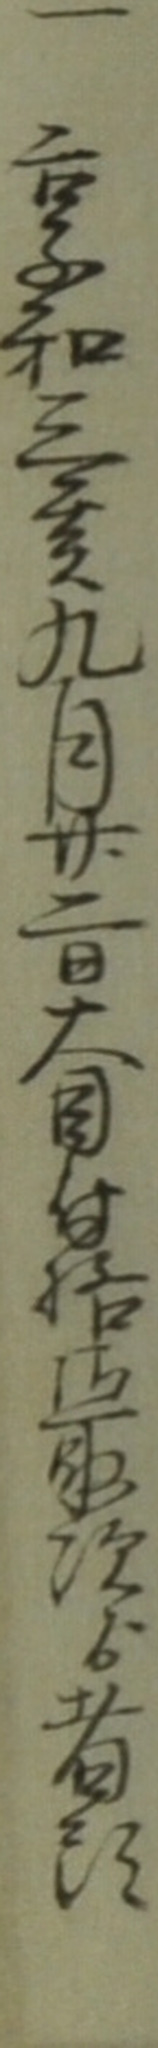一享和三亥九月廿二日大目付格御取次ゟ者頭

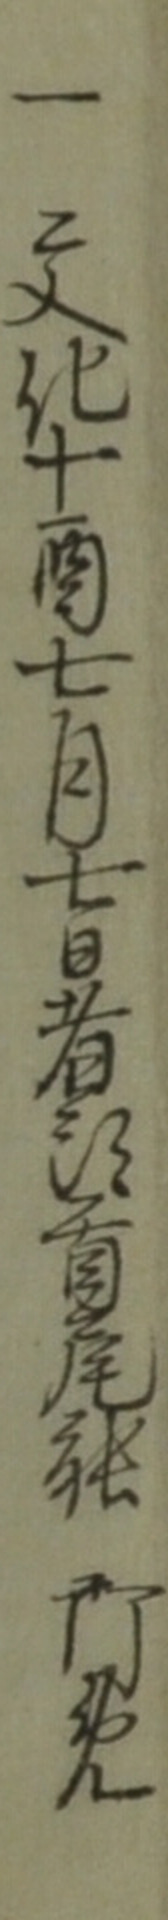一文化十酉七月七日者頭首尾能御免
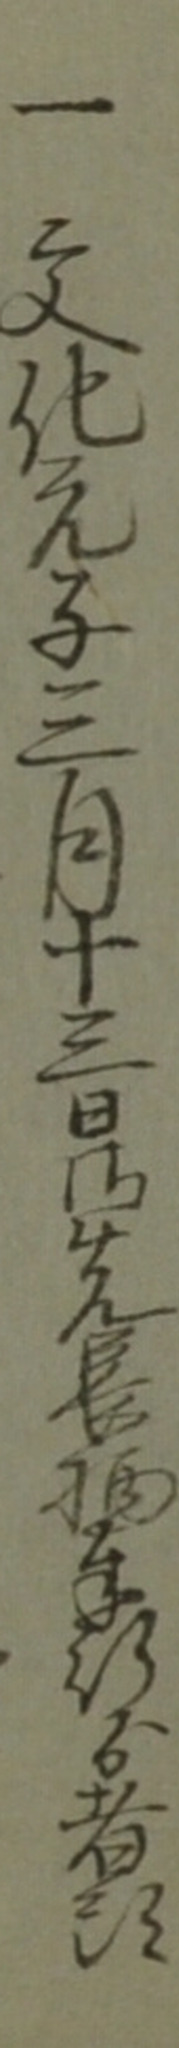一文化元子三月十三日御先長柄奉行ゟ者頭
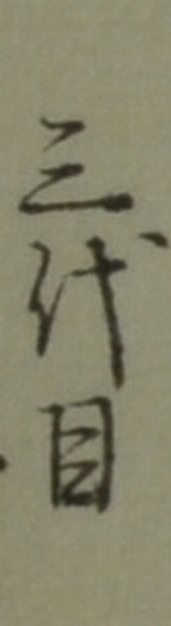三代目
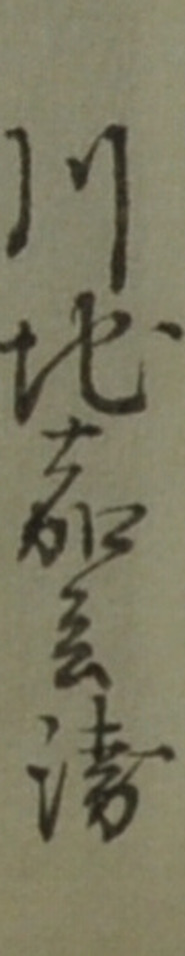川北嘉兵衛
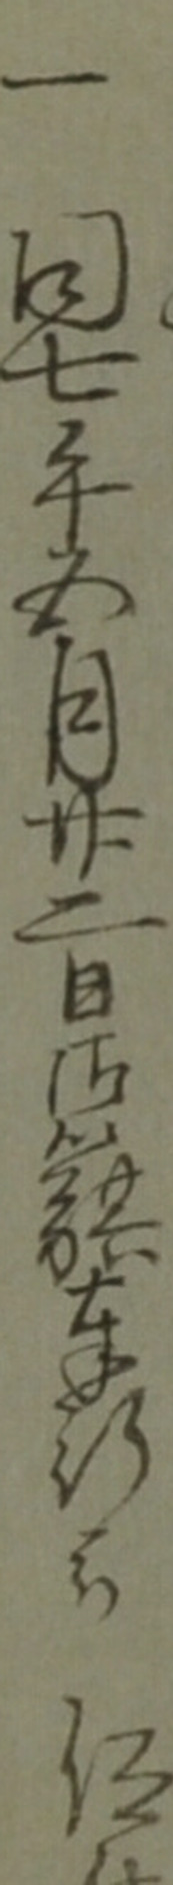一同七午五月廿二日御籏奉行被仰付
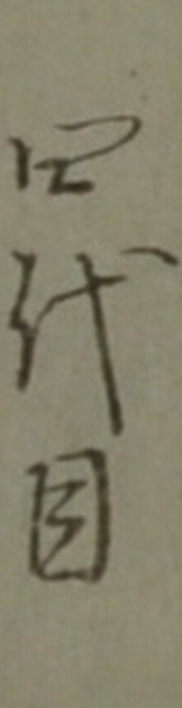四代目
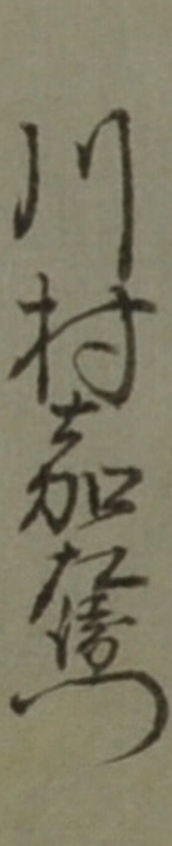川村嘉左衛門
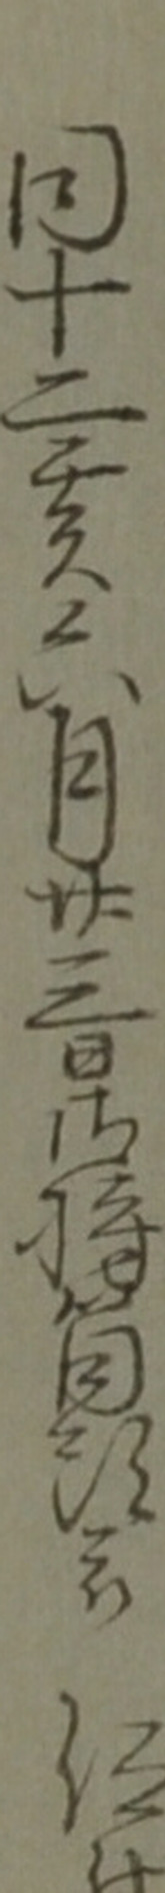一同十二亥六月廿三日御持筒頭被仰付
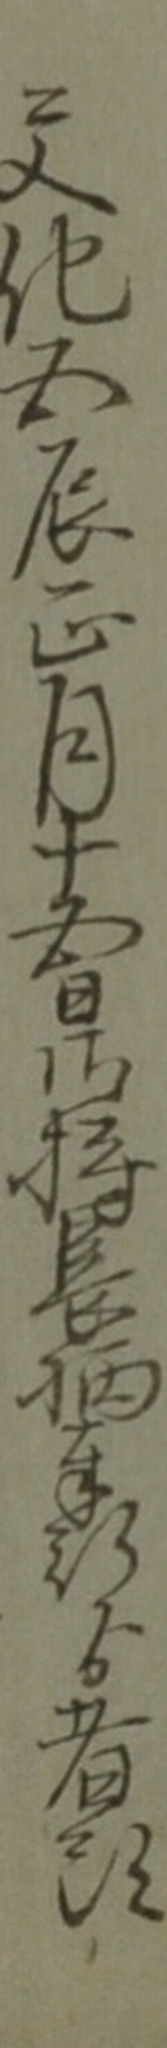一文化五辰正月十五日御持長柄奉行ゟ者頭
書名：諸御役代々録（二）
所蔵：伊那市立高遠町図書館・合同会社AMANE
